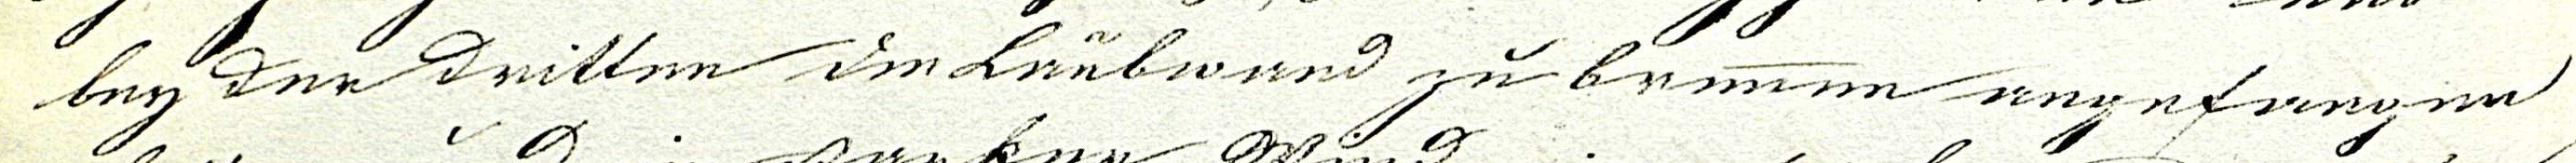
bey der dritten den Laubwand zu brennen angefangen
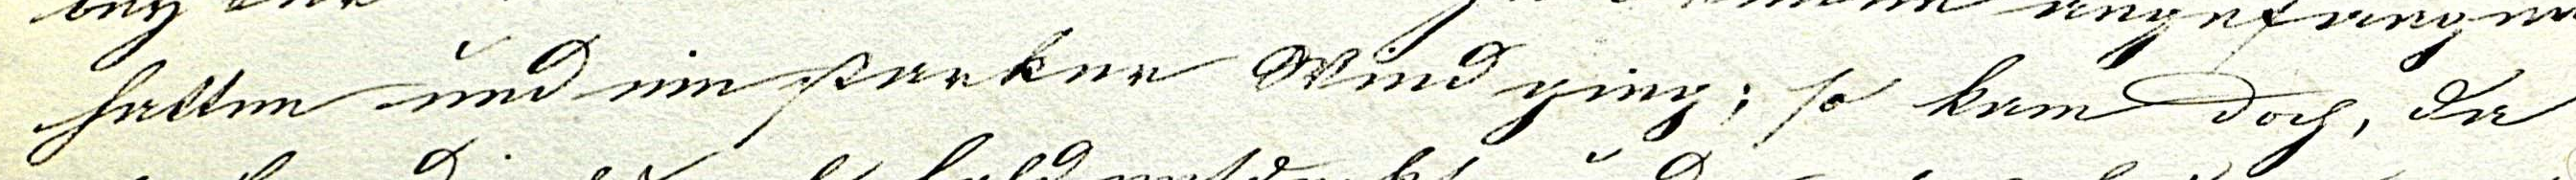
hatten du ein starken Wind ging; so kam doch, da
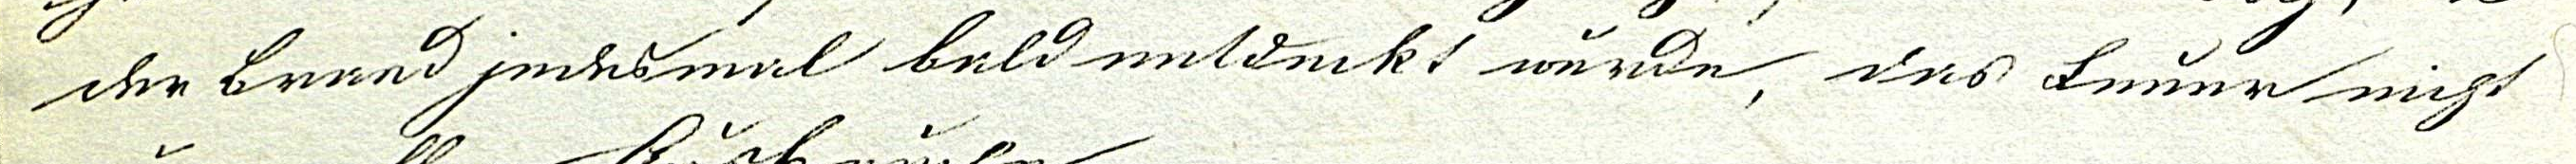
der Brand jedesmal bald entdeckt wurde, das Feuer nicht
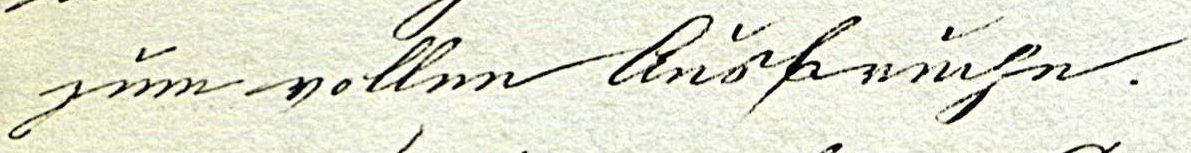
zum vollen Ausbruche.
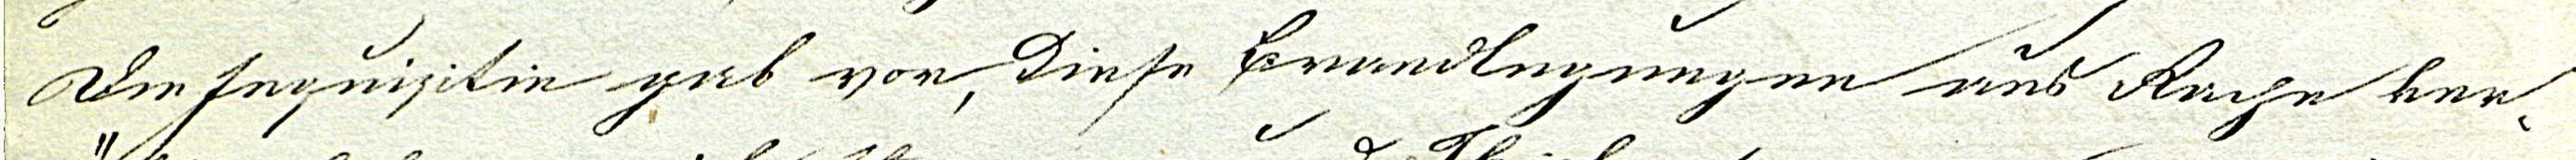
Der Inquisitin gab vor, diese Brandlegungen aus Rache ver¬
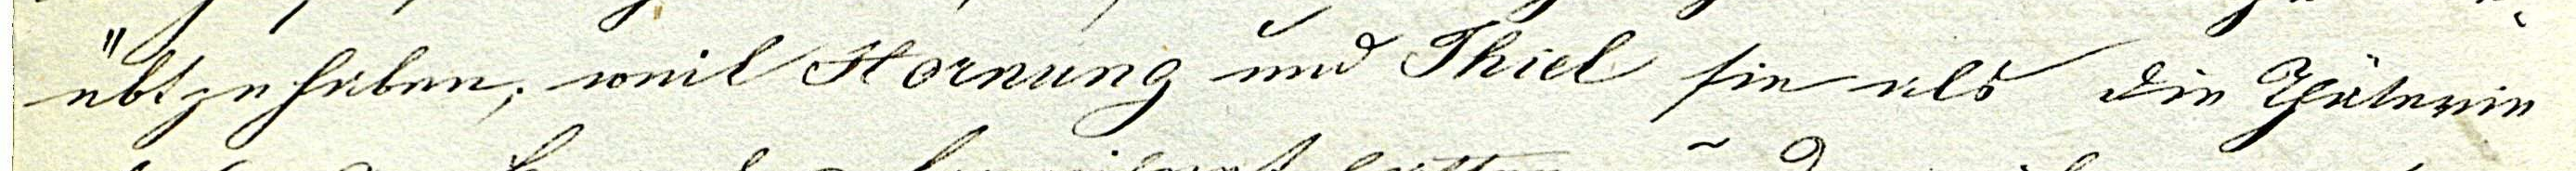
übt zu haben, weil Hornung und Thiel sie als die Thäterin
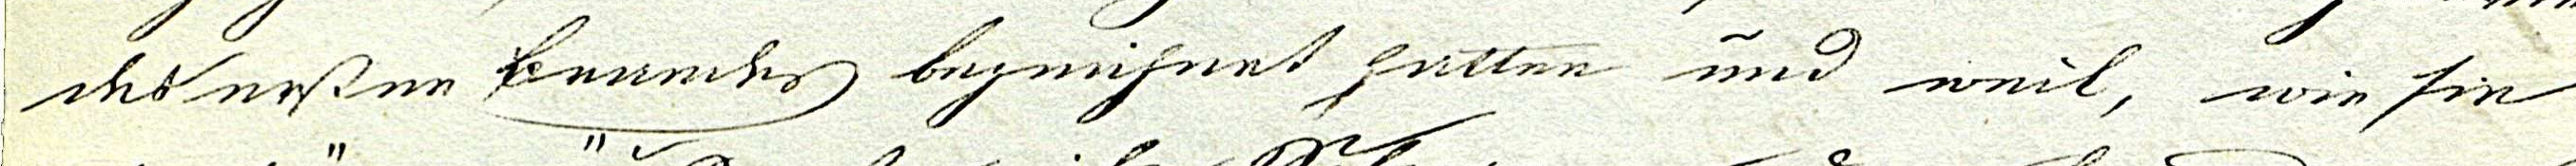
des ersten Brandes bezeichnet hatten und weil, wie sie
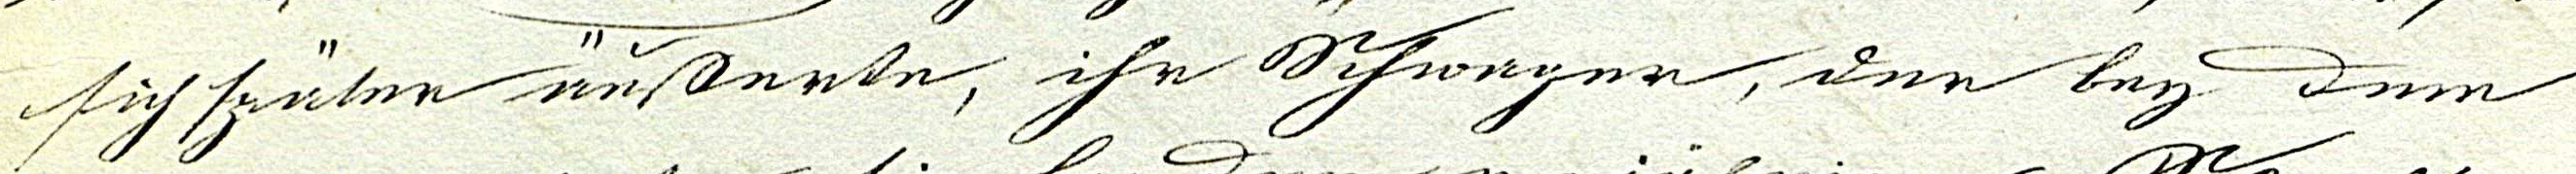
sich später äußerte, ihr Schwager, der bey dem
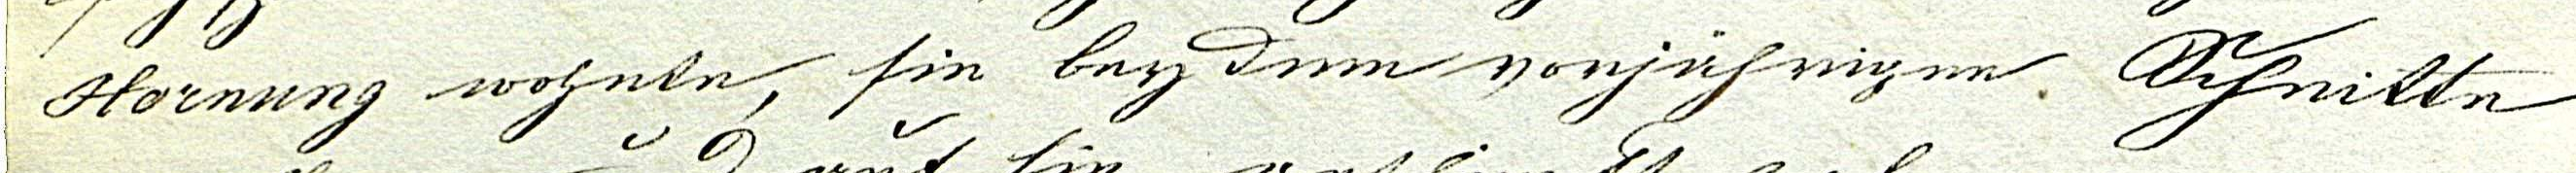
Hornung wohnte, sie bey dem vorjährigen Schnitte
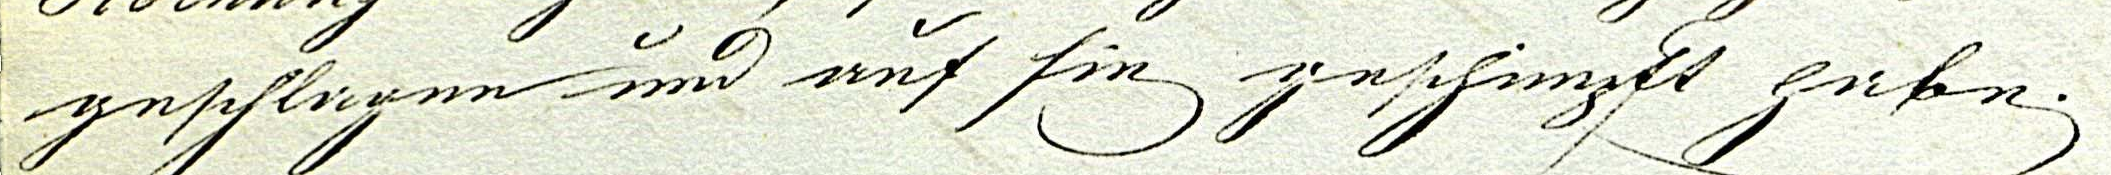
geschlagen und auf sie geschimpft habe.
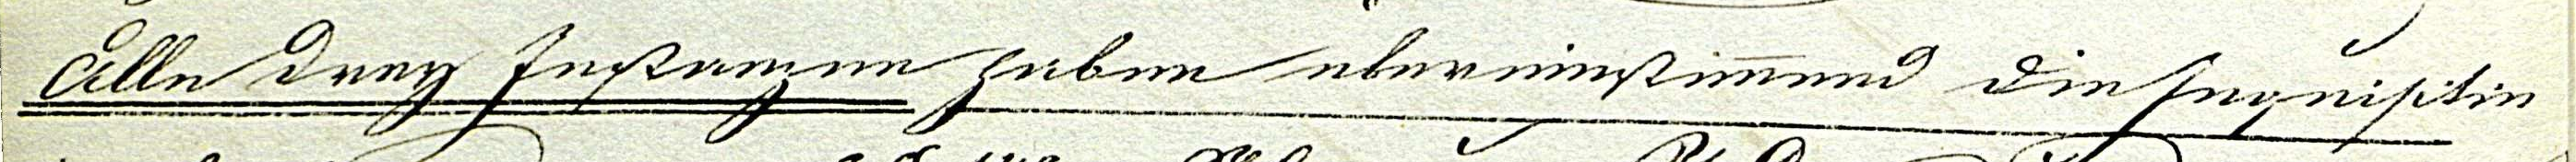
Alle drey Instanzen haben übereinstimmend die Inquisitin
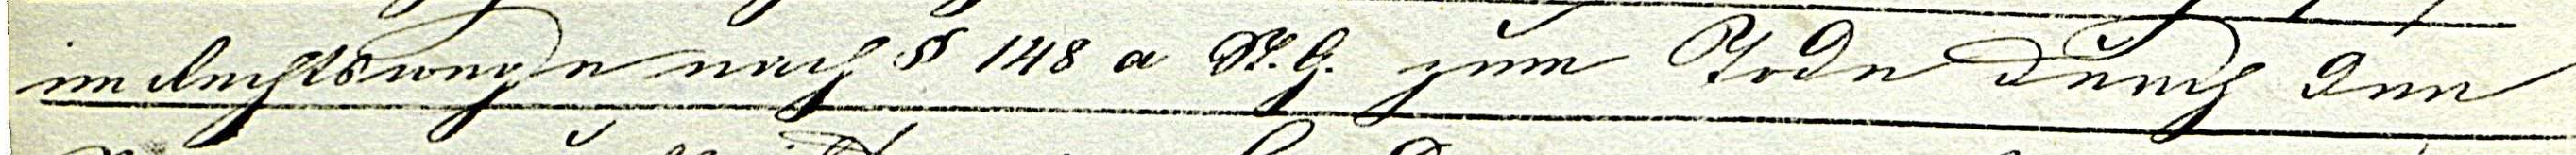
im Rechtswege nach §§148 a StG zum Tode durch den
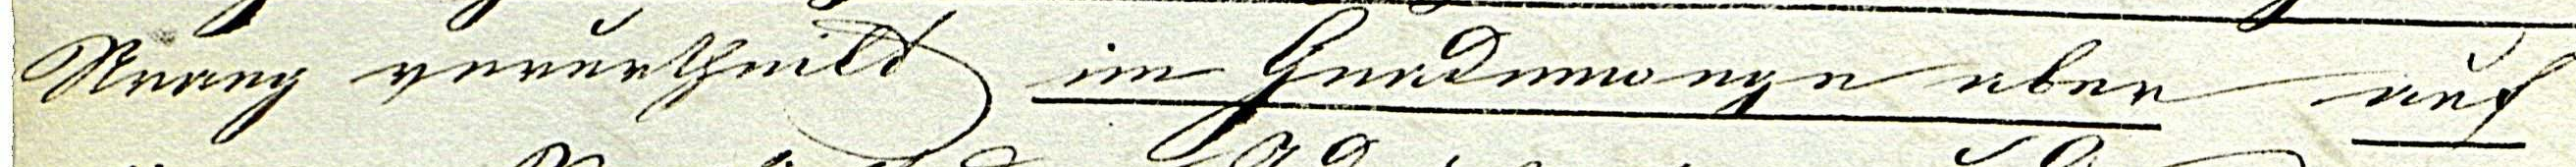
Strang verurtheilt im Gnadenwege aber auf
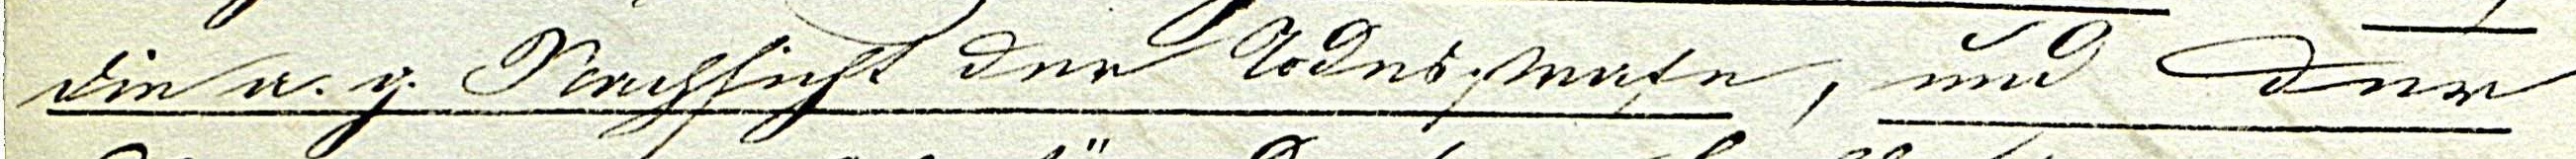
die a.g. Nachsicht der Todesstrafe, und der
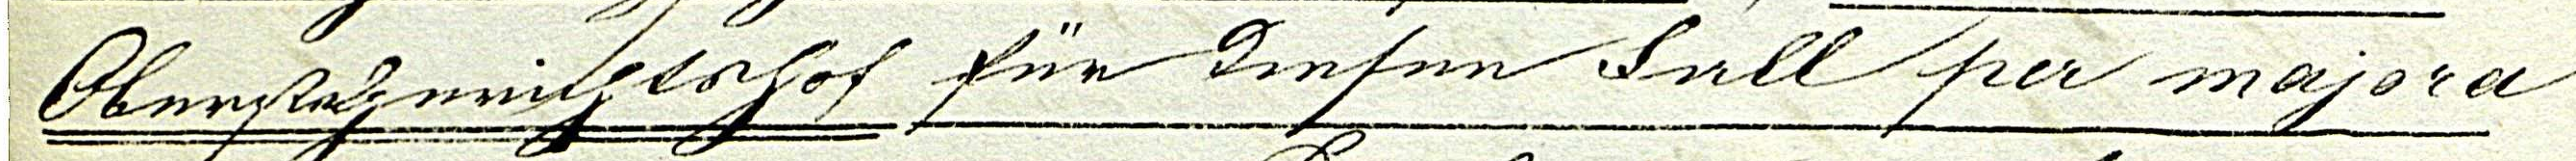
Oberste Gerichtshof für diesen Fall per majora
